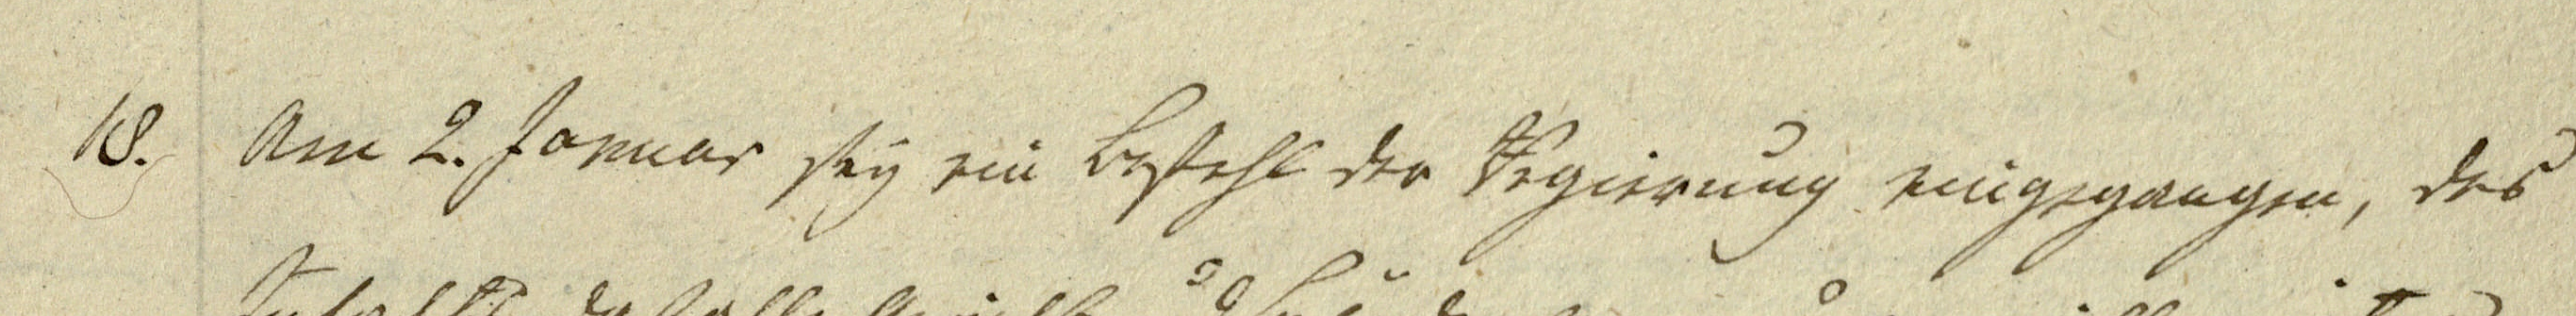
18. Am 2. Januar seÿ ein Befehl der Regierung eingegangen, des
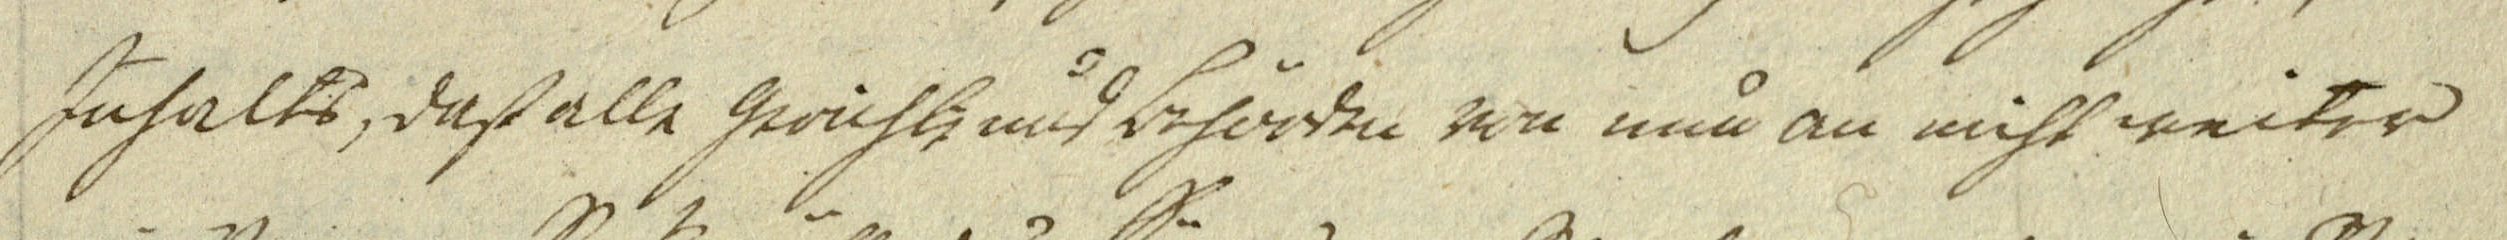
Inhalts, daß alle Gerichte und Behörden von nun an nicht weiter
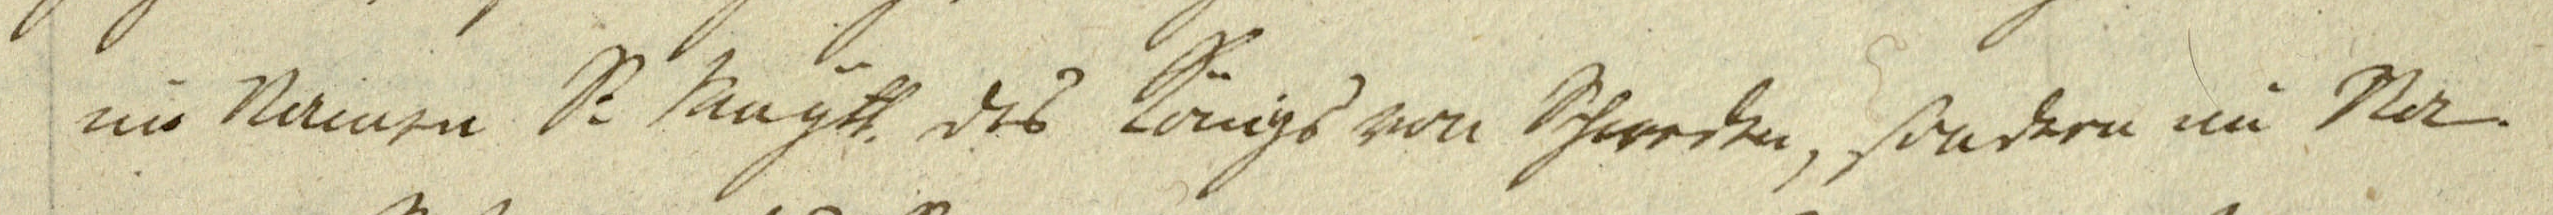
im Namen Sr Maÿtt. des Königs von Schweden, sondern im Na¬
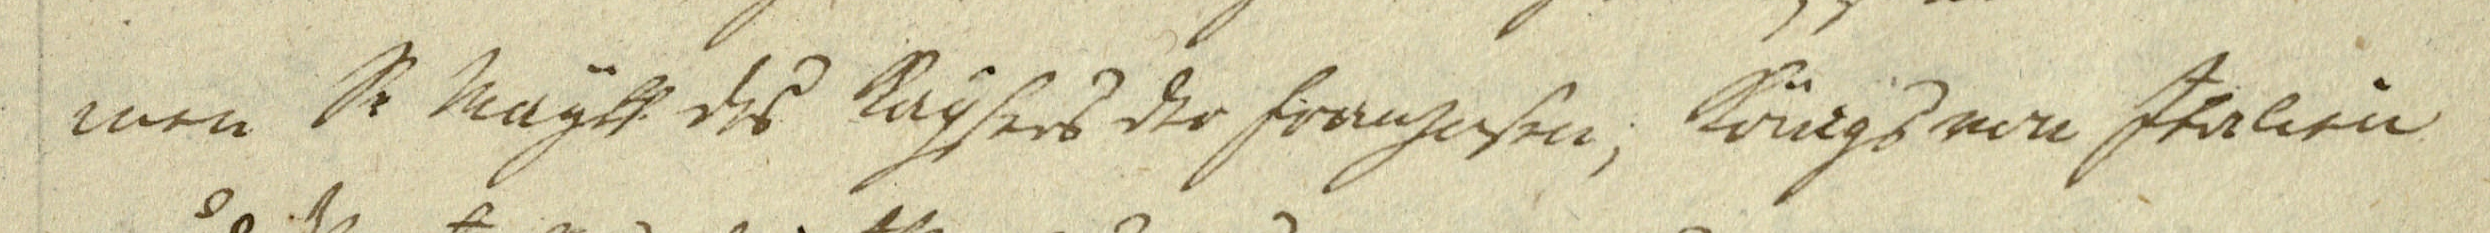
men Sr Maÿtt. des Kaÿsers der Franzosen, Königs von Italien
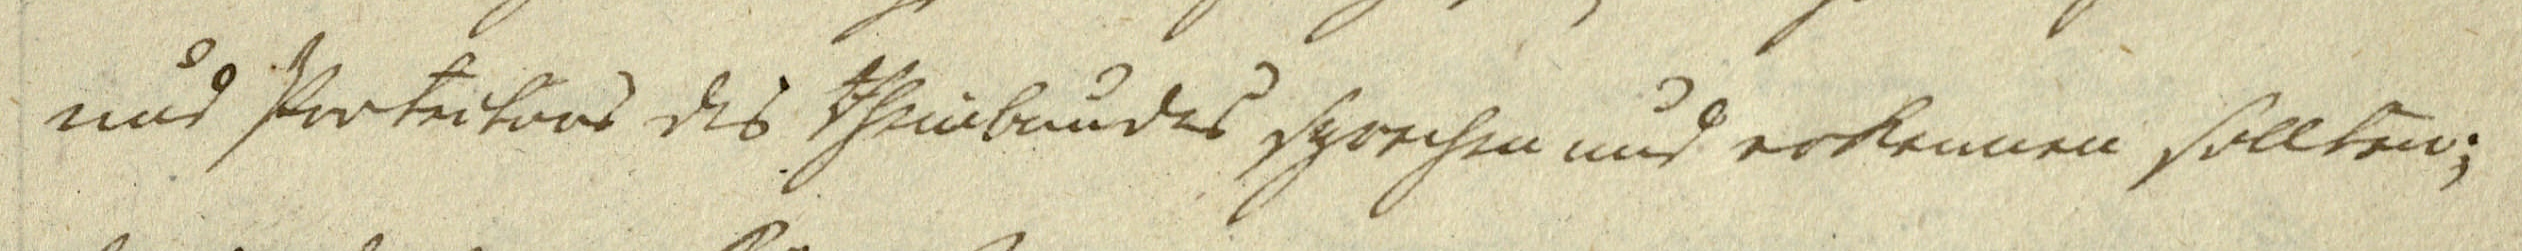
und Protectors des Rheinbundes sprechen und erkennen sollten;
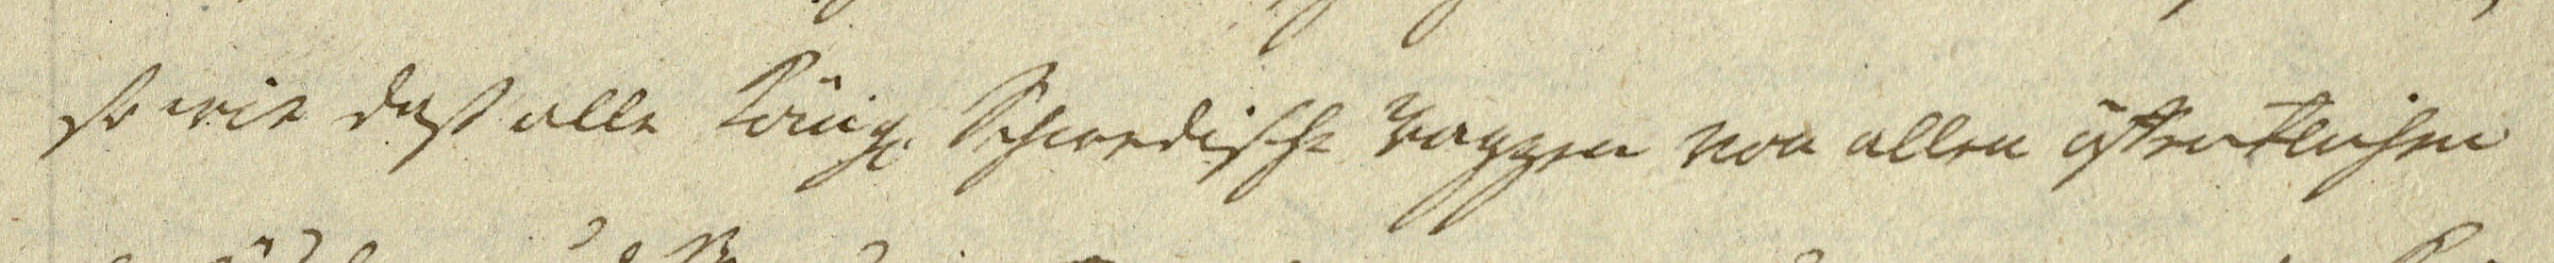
so wie daß alle Königl. Schwedische Wappen von allen öffentlichen
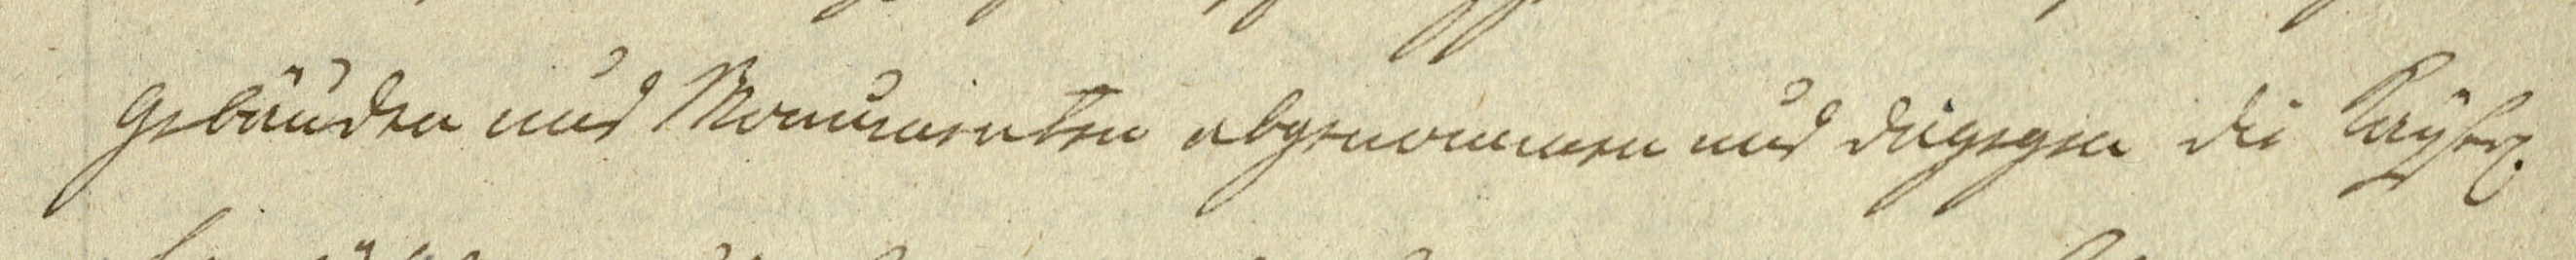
Gebäuden und Monumenten abgenommen und dagegen die Kaÿserl.
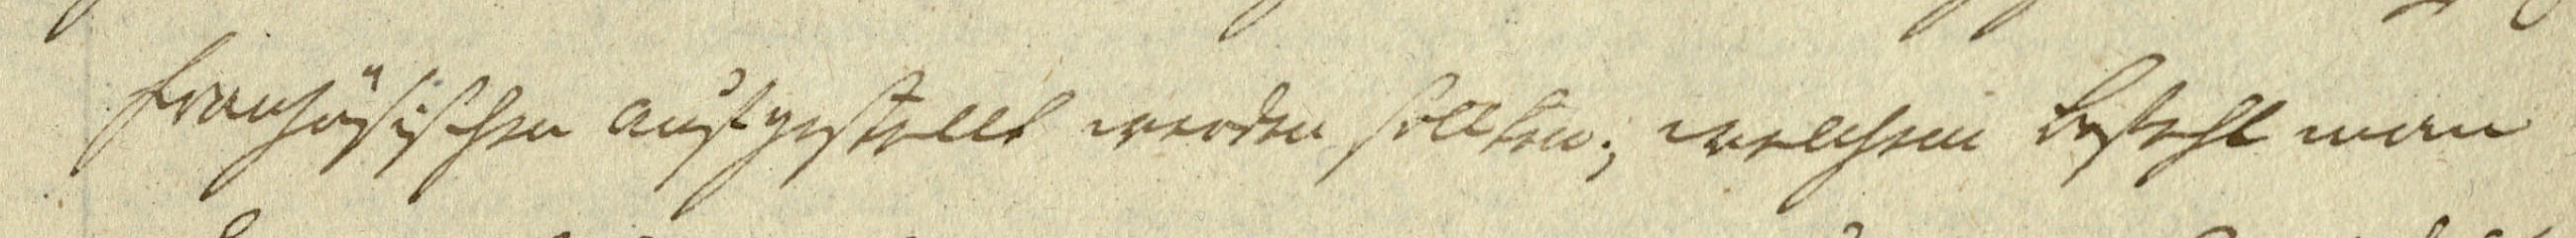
Französischen aufgestellt werden sollten, welchem Befehl man
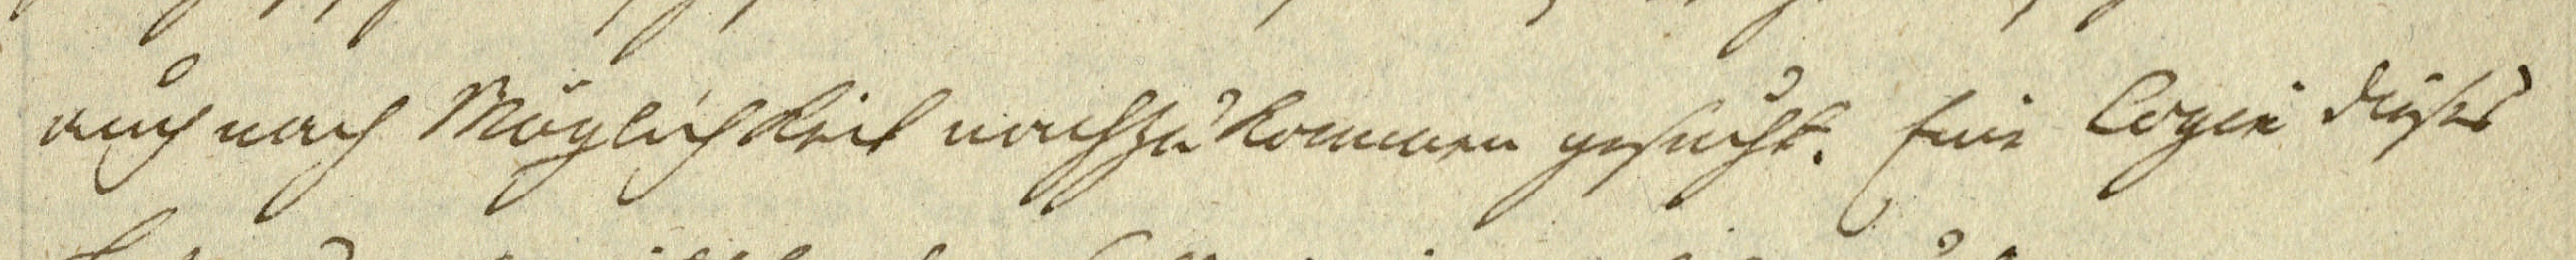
auch nach Möglichkeit nachzukommen gesucht. Eine Copie dieses
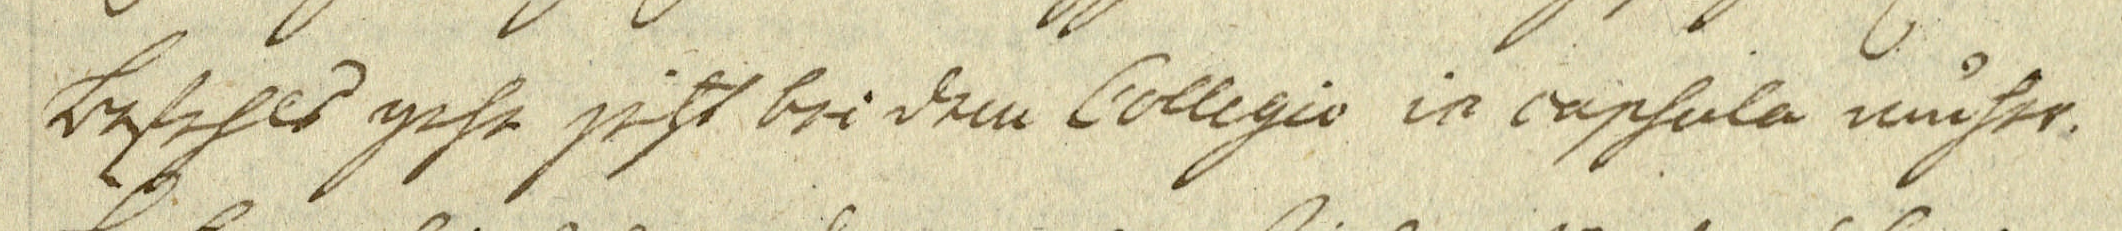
Befehls gehe jetzt bei dem Collegio in capsula umher.
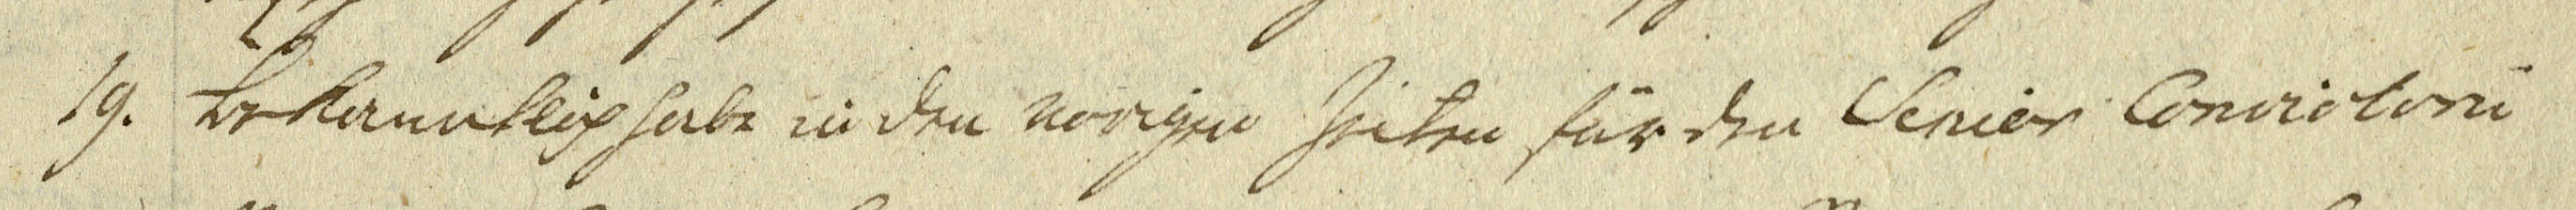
19. Bekanntlich habe in den vorigen Zeiten für den Senior Convictorii
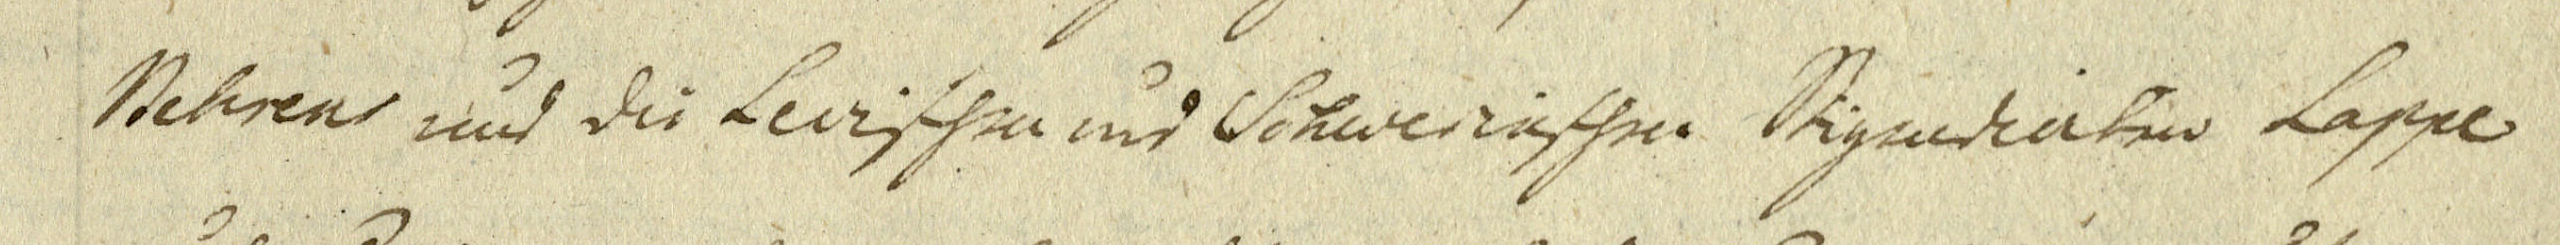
Nehren und die Levischen und Schwerinschen Stipendiaten Lappe
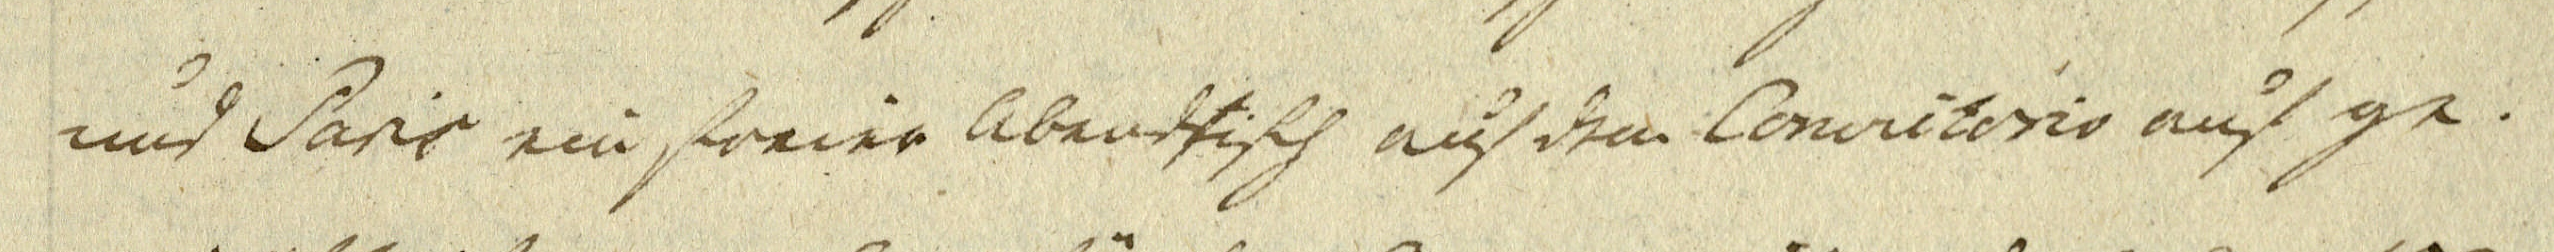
und Paris ein freier Abendtisch auf dem Convictorio auf ge¬
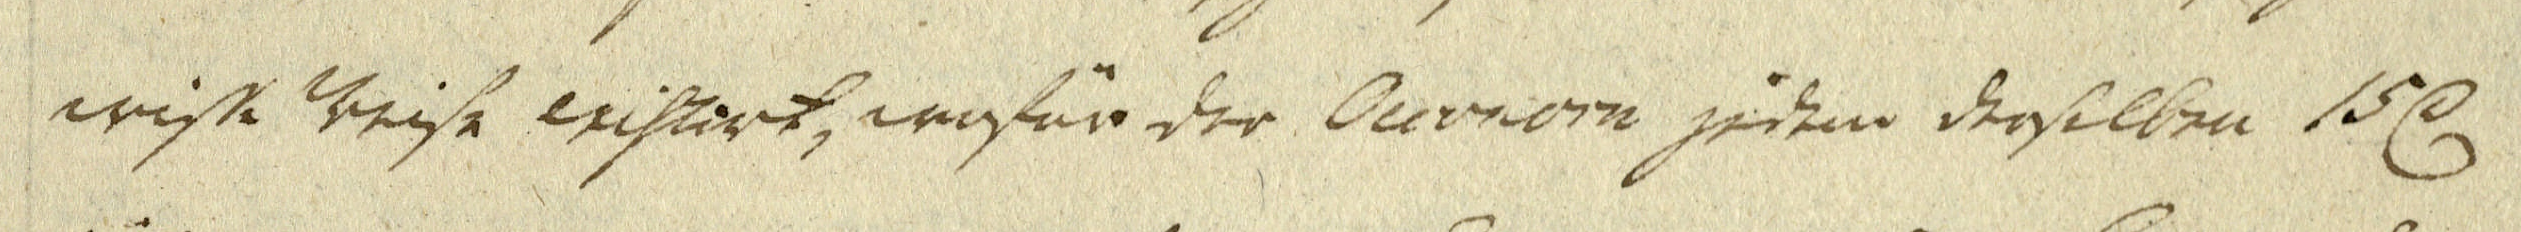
wisse Weise existirt, wofür der Oeconom jedem derselben 15 l.
